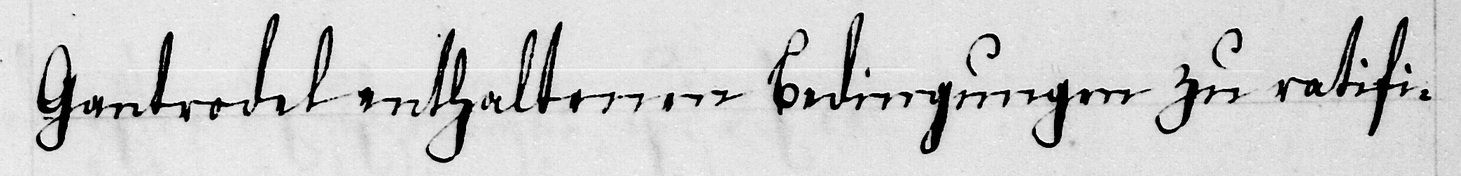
Gantrodel enthaltenen Bedingungen zu ratifi¬
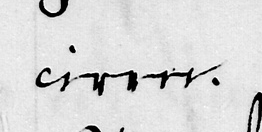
ciren.
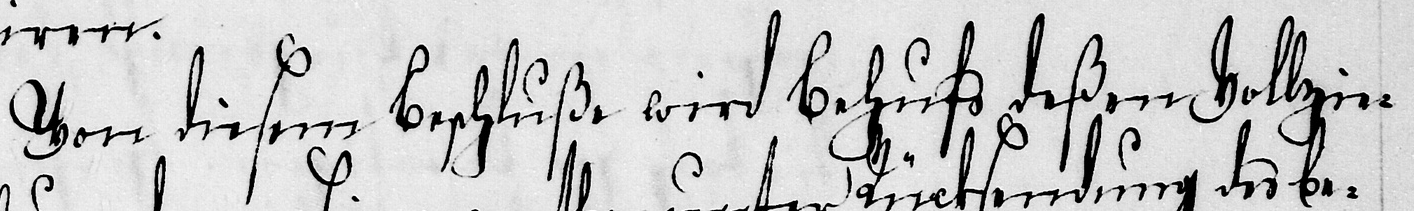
Von diesem Beschluße wird Behufs deßen Vollzi¬
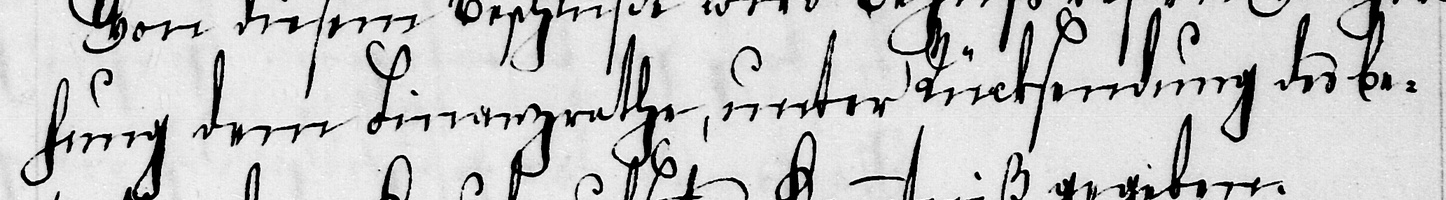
ehung dem Finanzrathe, unter Rücksendung des be¬
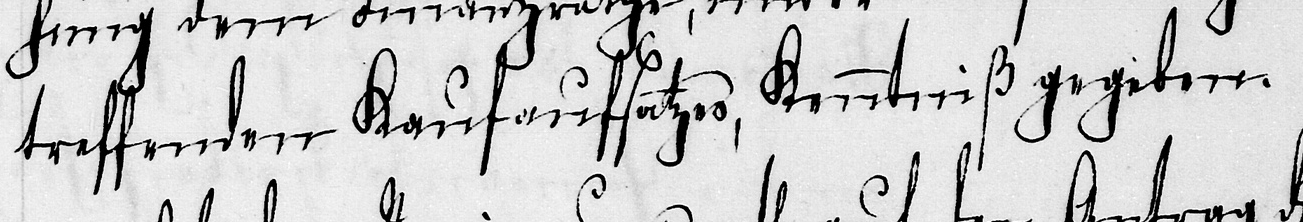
treffenden Kaufaufsatzes, Kenntniß gegeben.
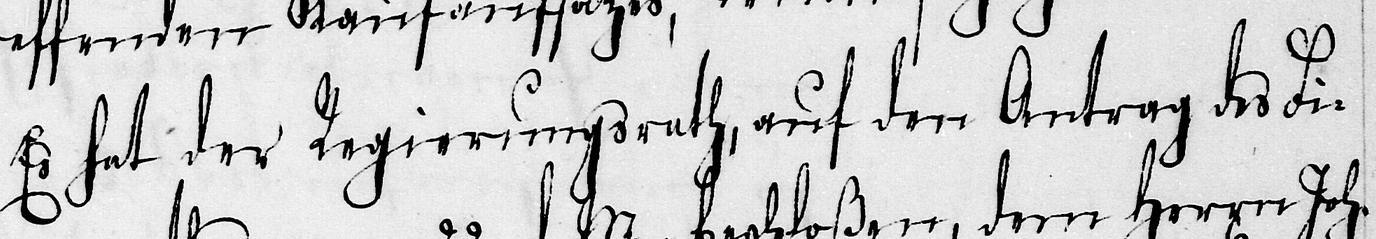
Es hat der Regierungsrath, auf den Antrag des Fi¬
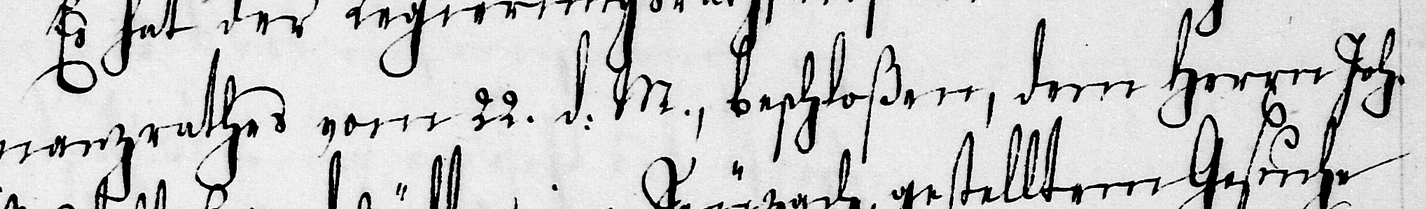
nanzrathes vom 22. d. M., beschloßen, dem Herrn Joh.
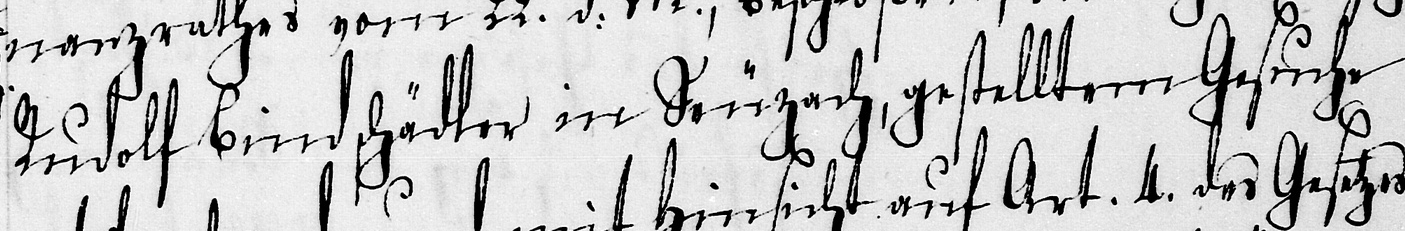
Rudolf Bindschädler in Seuzach, gestelltem Gesuche
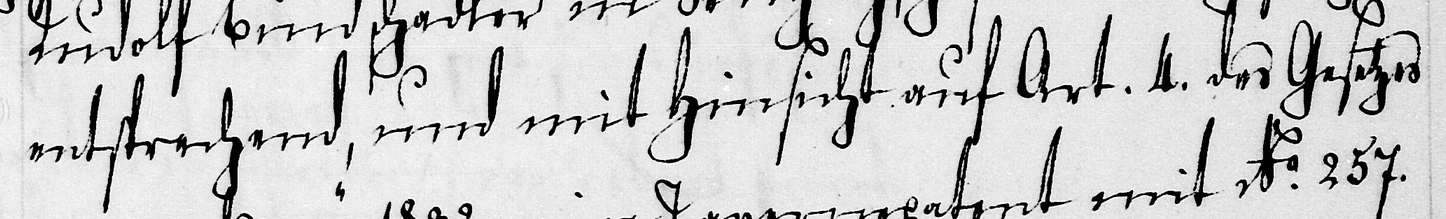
entsprechend, und mit Hinsicht auf Art. 4. des Gesetzes
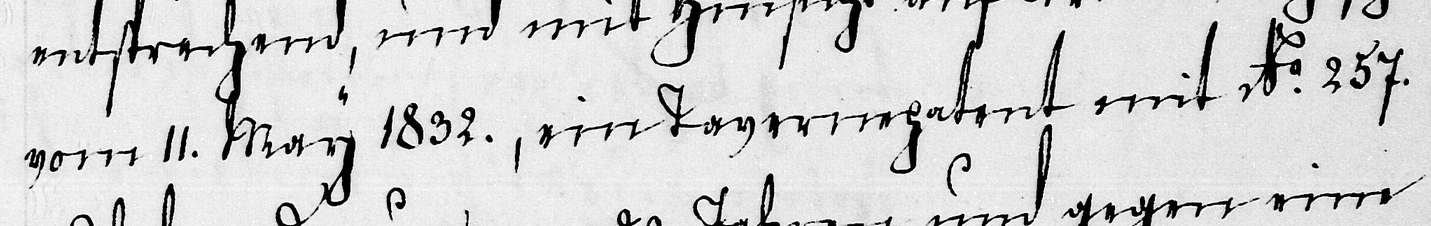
vom 11. May 1832., ein Tavernepatent mit No. 257.
